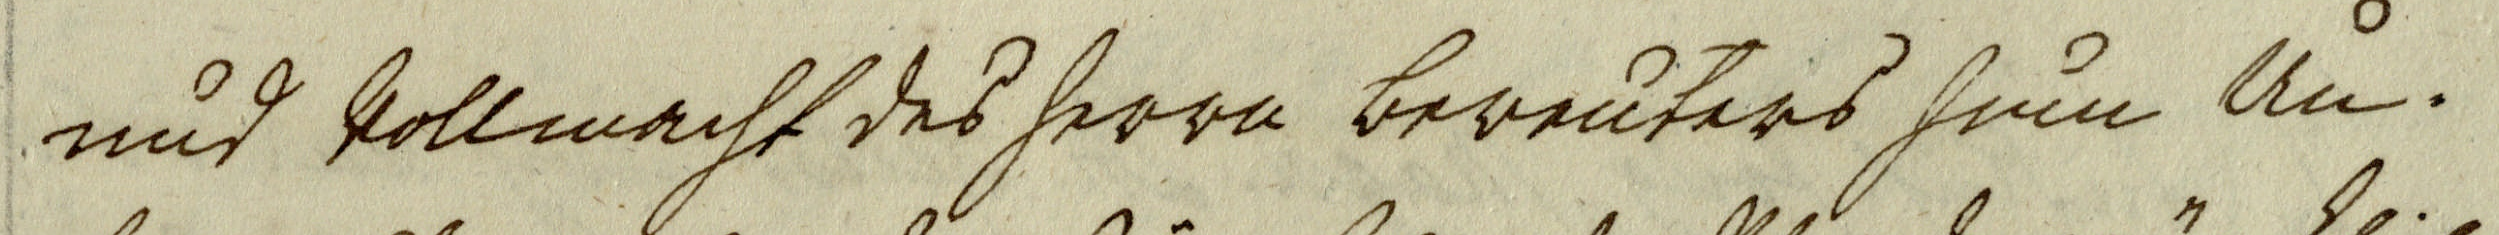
und Vollmacht des Herrn Bereuters zum Un¬
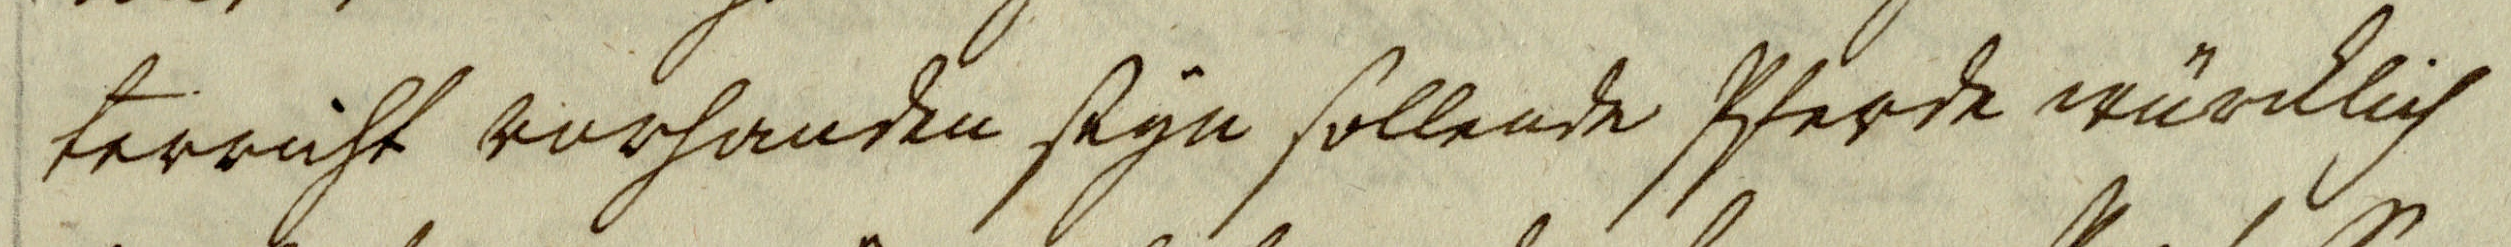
terricht vorhanden seÿn sollende Pferde würcklich
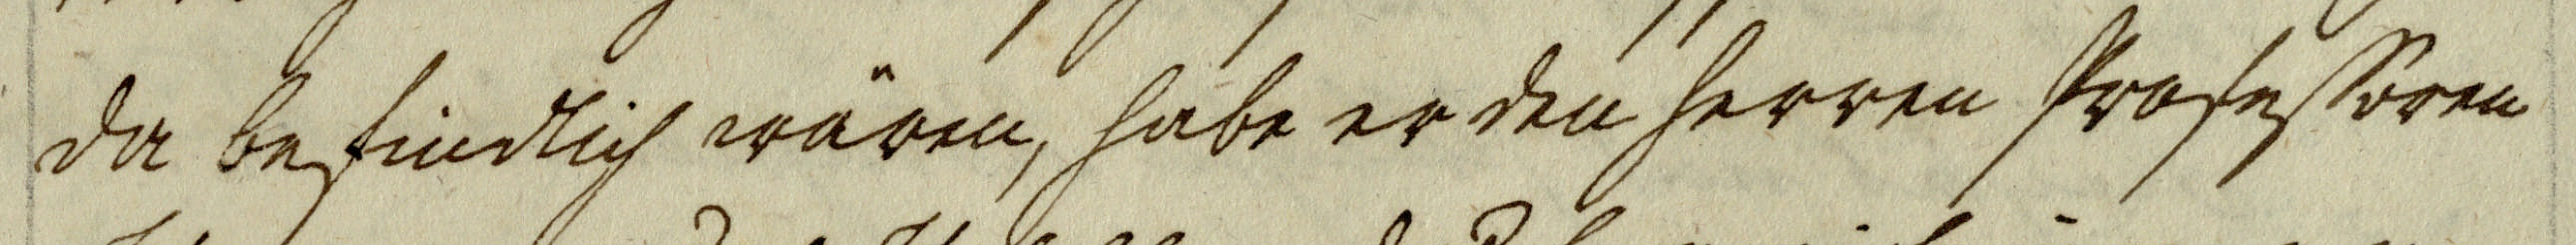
da befindlich wären, habe er den Herren Professoren
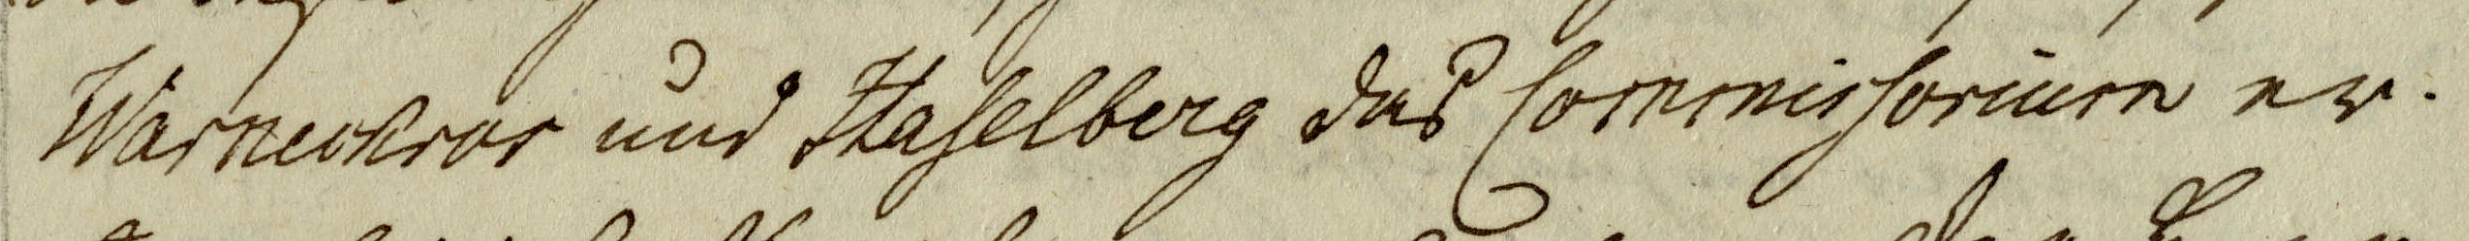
Warneckros und Haselberg das Commissorium er¬
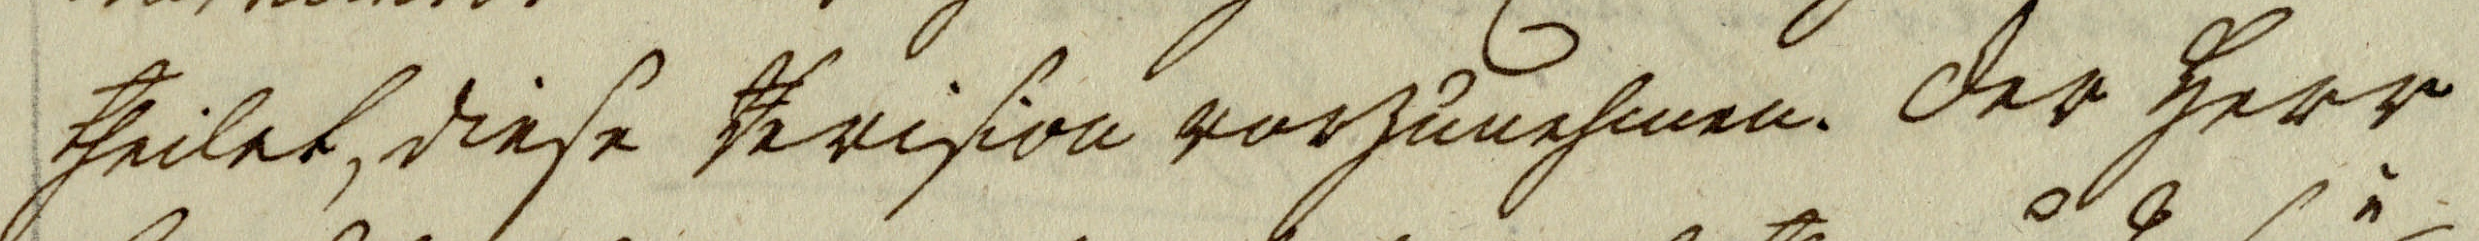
theilet, diese Revision vorzunehmen. Der Herr
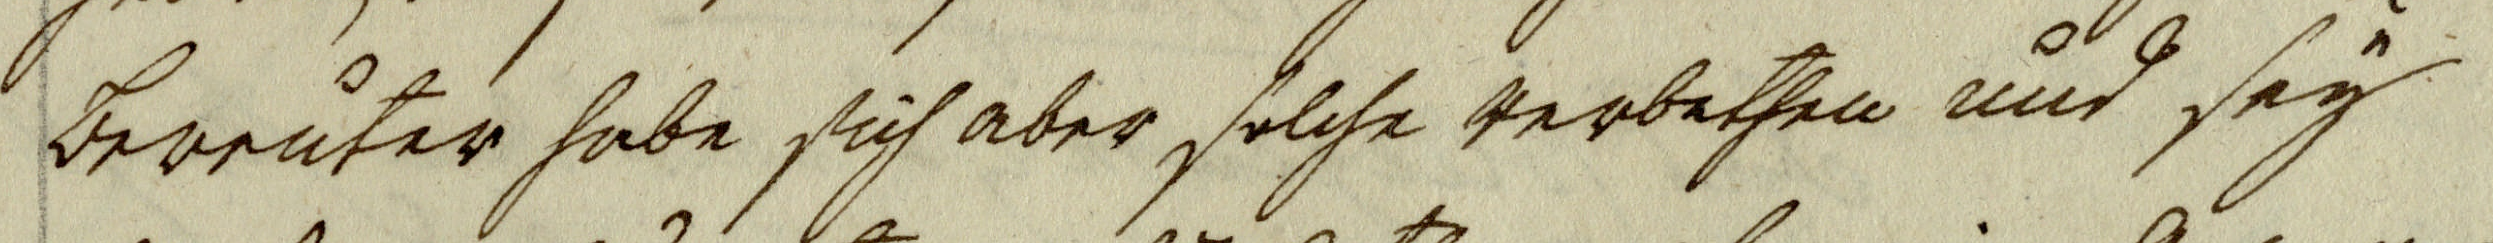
Bereuter habe sich aber solche verbethen und seÿ
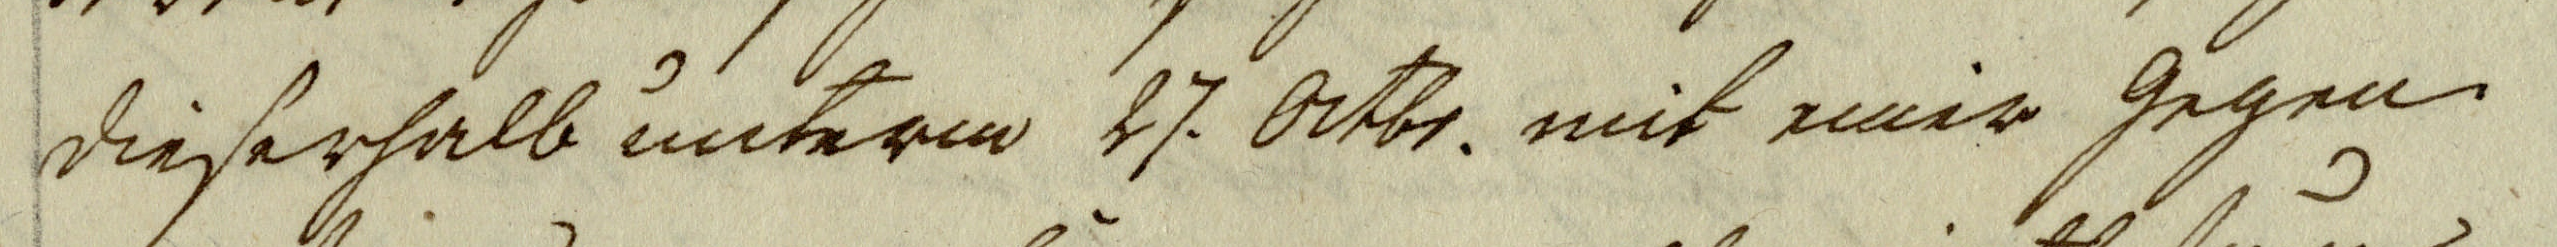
dieserhalb unterm 27. Octbr. mit einer Gegen¬
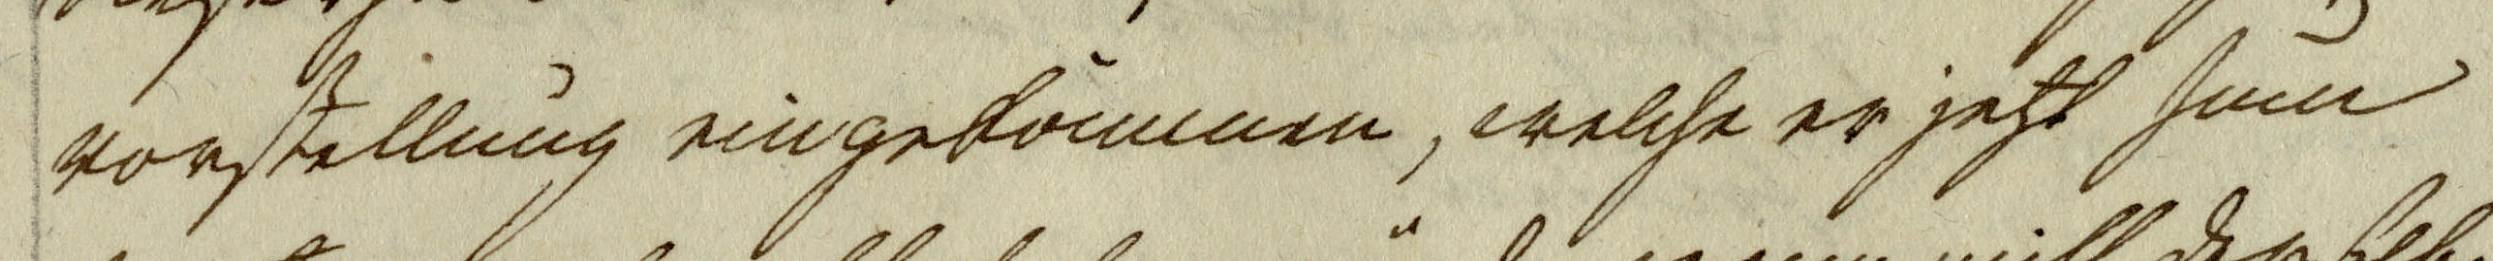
vorstellung eingekommen, welche er jetzt zum
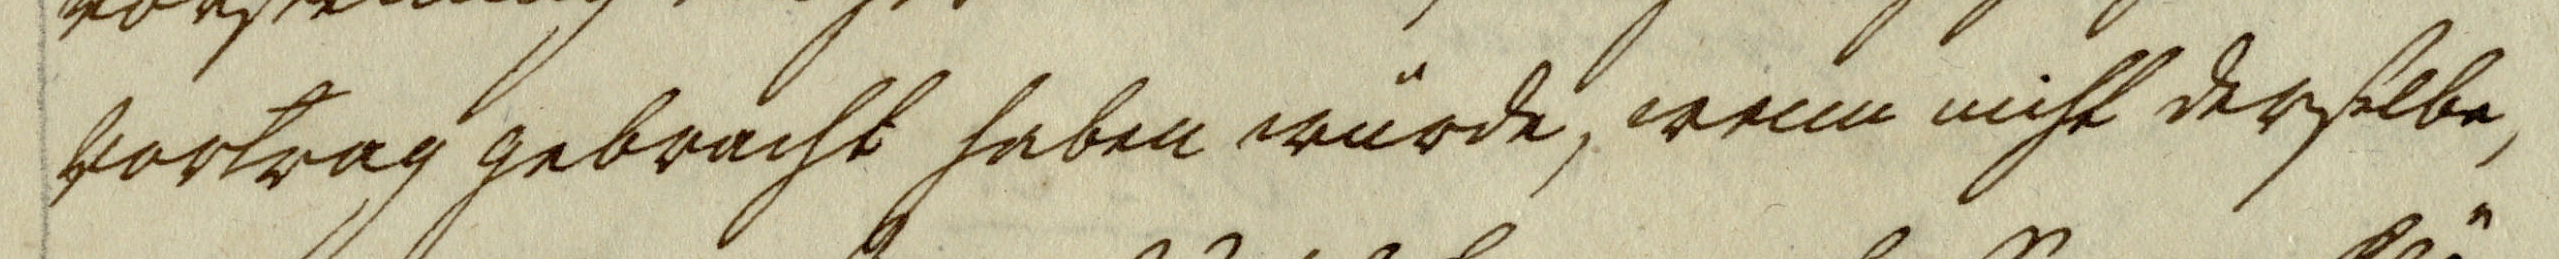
Vortrag gebracht haben würde, wenn nicht derselbe,
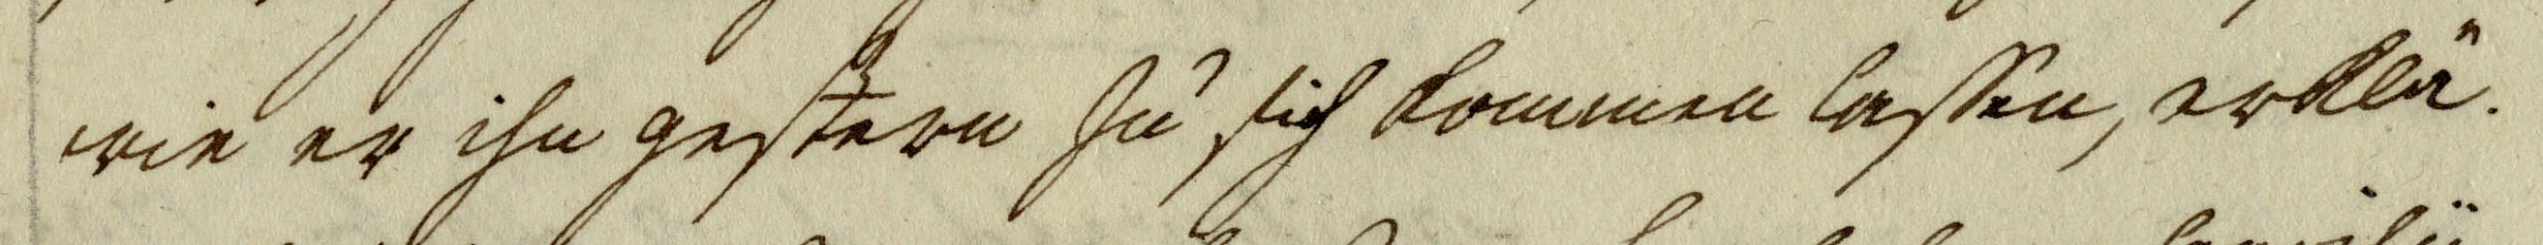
wie er ihn gestern zu sich kommen lassen, erklä¬
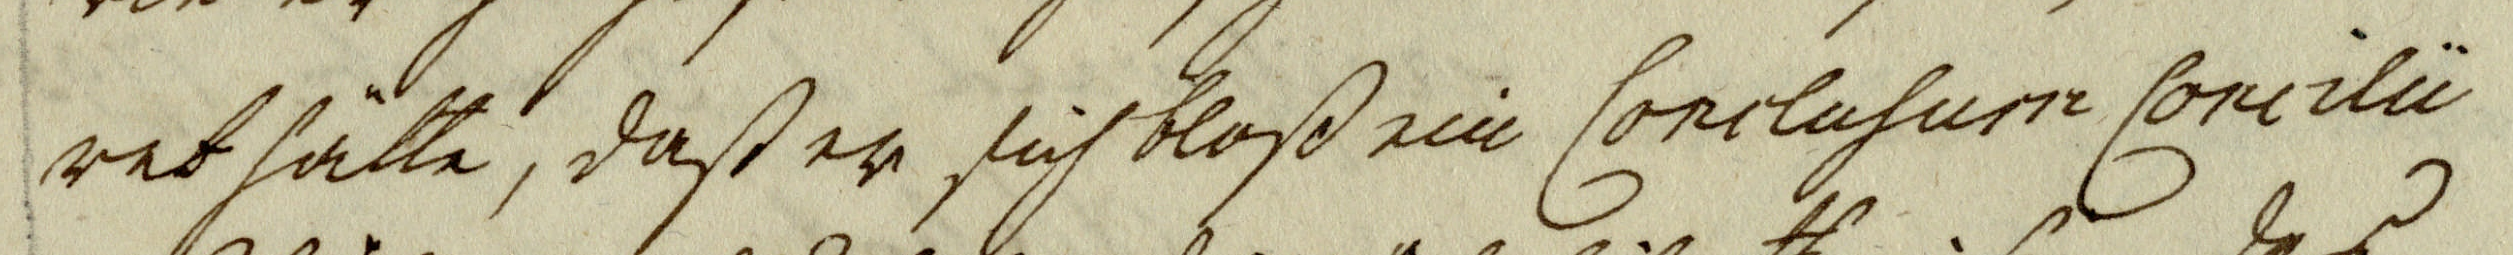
ret hätte, daß er sich bloß ein Conclusum Concilii
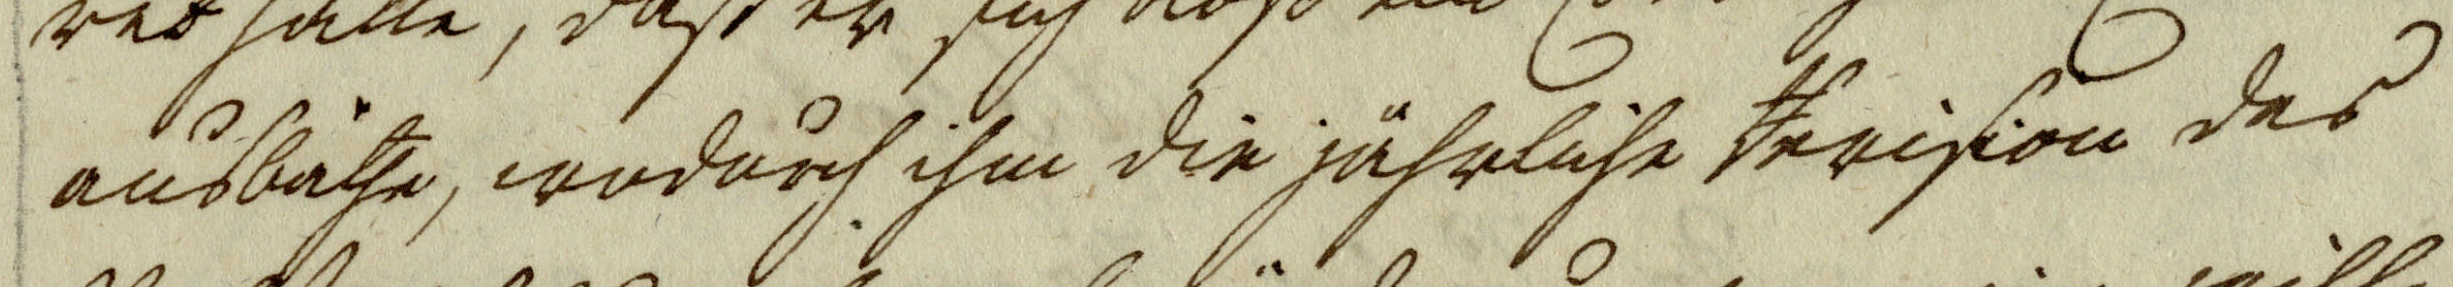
ausbäthe, wodurch ihm die jährliche Revision des
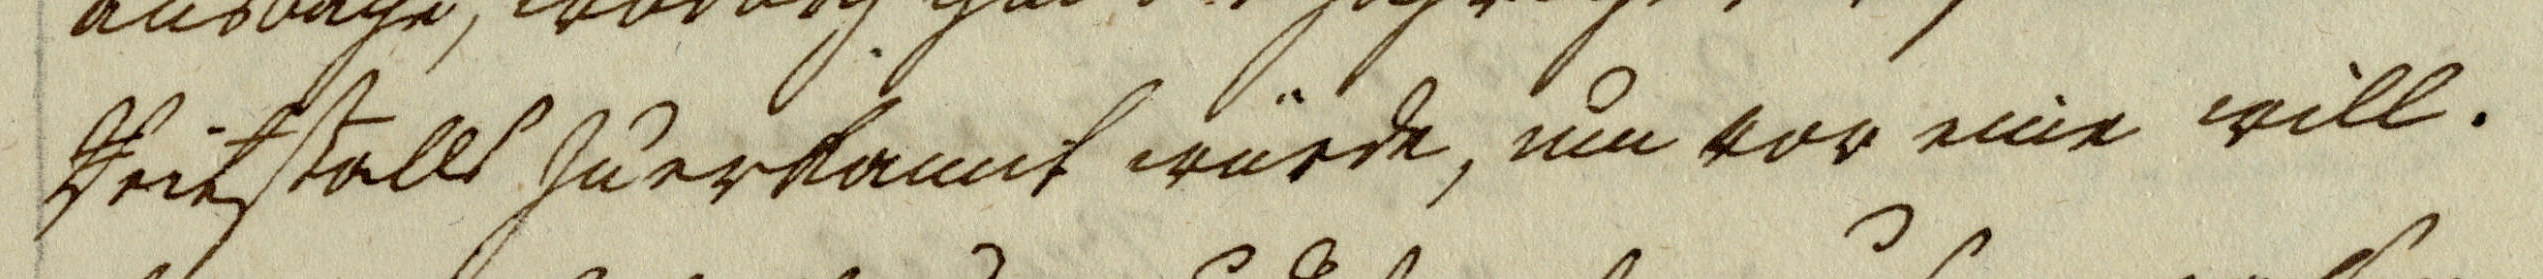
Reitstalls zuerkannt würde, um vor eine will¬
